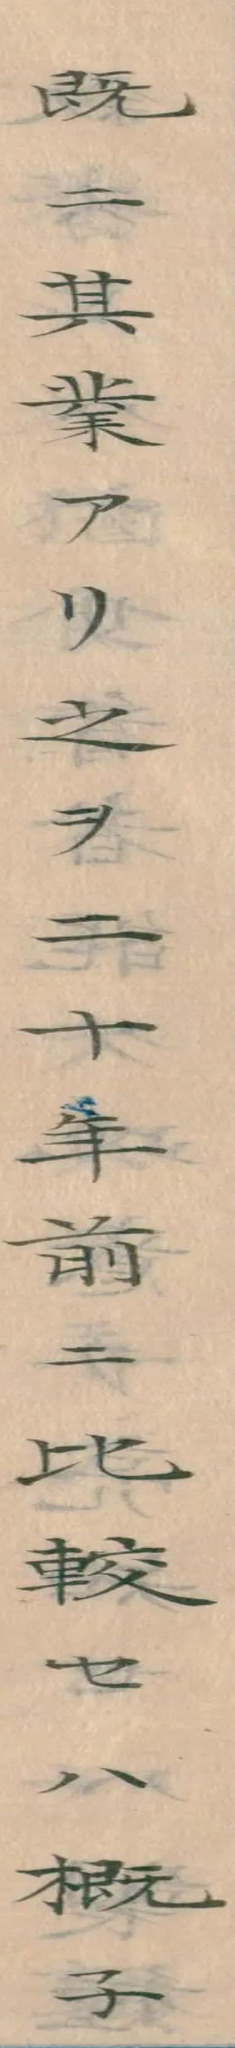既ニ其業アリ之ヲ二十年前ニ比較セハ概ネ
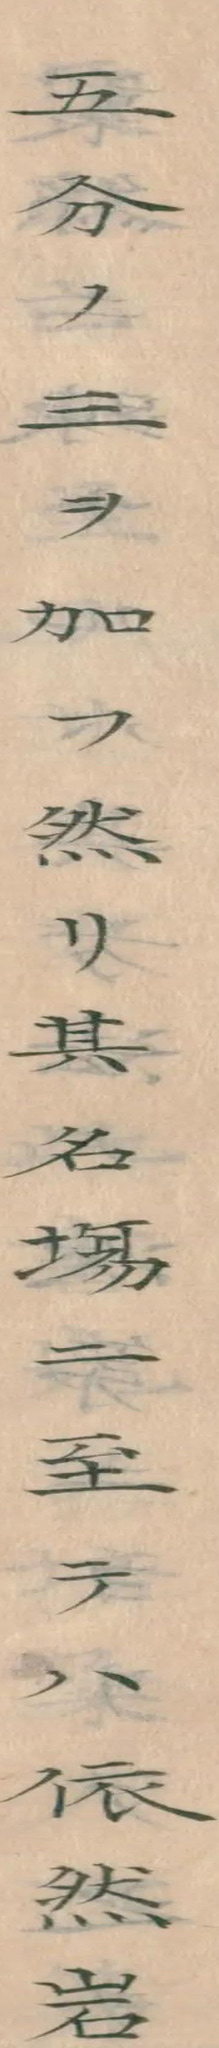五分ノ三ヲ加フ然リ其名場ニ至テハ依然岩
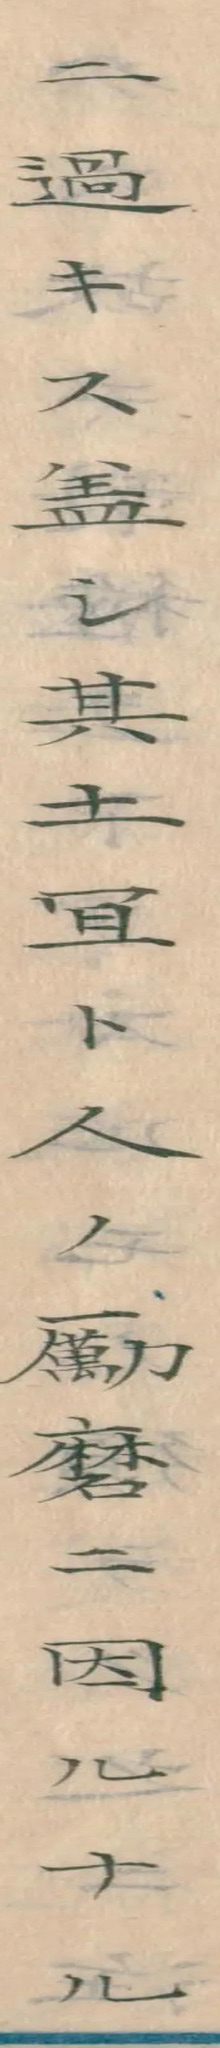ニ過キス蓋シ其土宜ト人ノ励磨ニ因ルナル
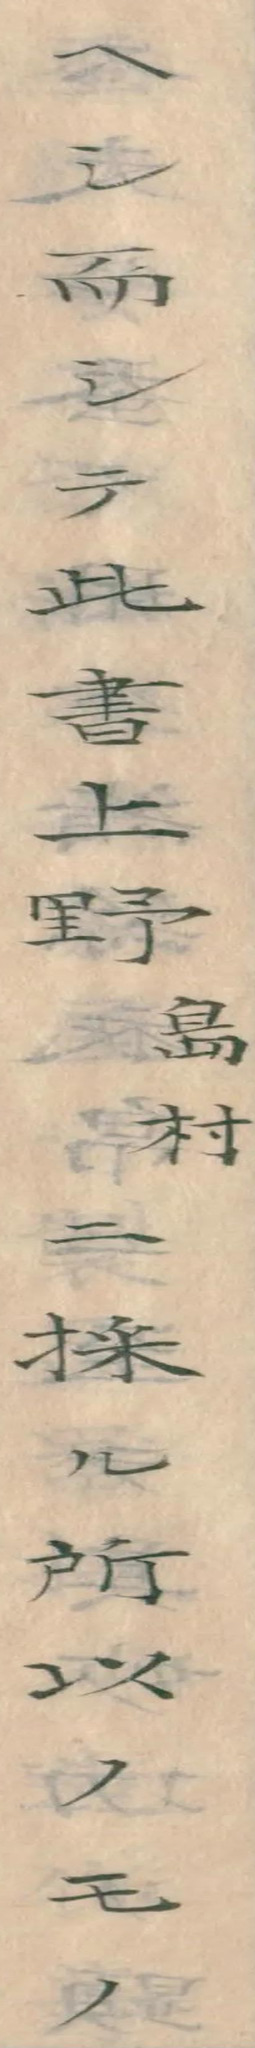ヘシ而シテ此書上野島村ニ採ル所以ノモノ
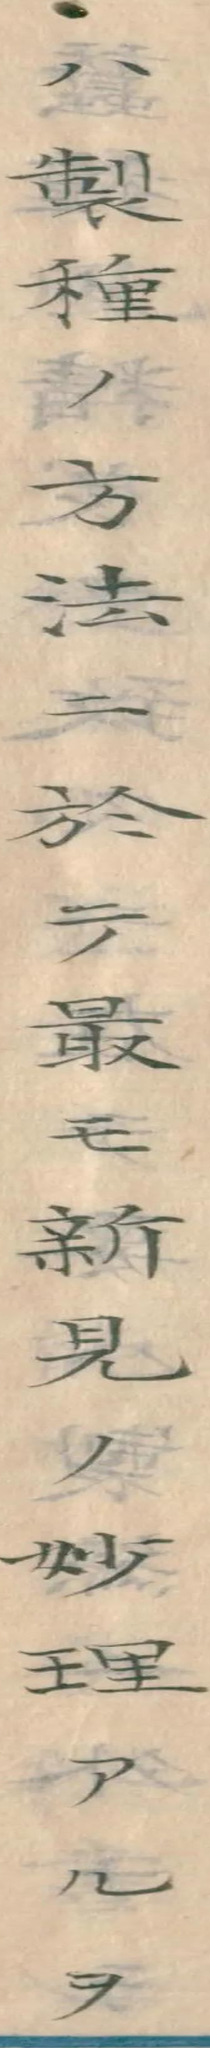ハ製種ノ方法ニ於テ最モ新見ノ妙理アルヲ
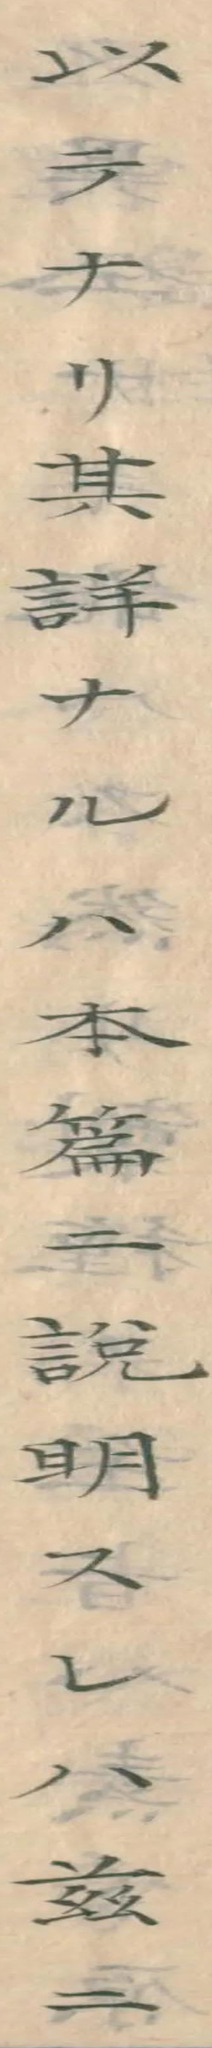以テナリ其詳ナルハ本篇ニ説明スレハ茲ニ
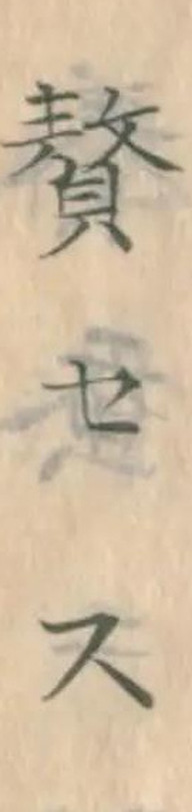贅セス

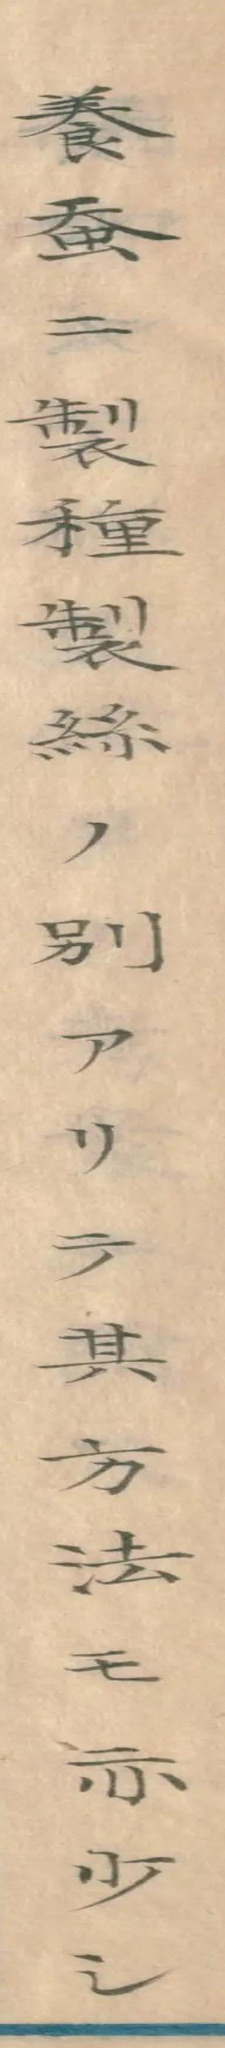一養蚕ニ製種製糸ノ別アリテ其方法モ亦少シ
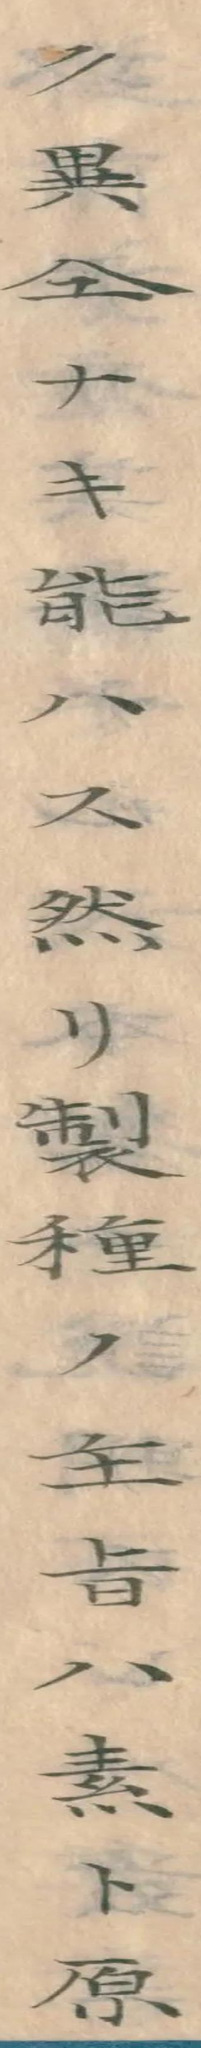ク異仝ナキ能ハス然リ製種ノ主旨ハ素ト原
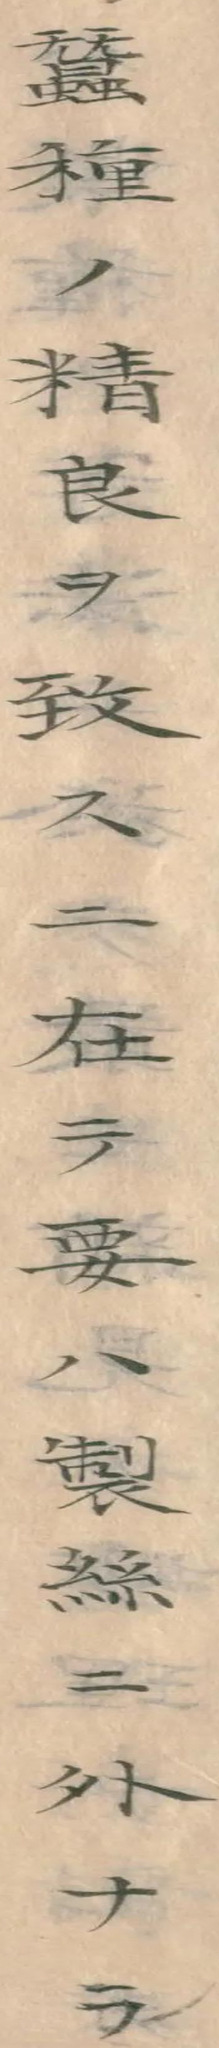蚕種ノ精良ヲ致スニ在テ要ハ製糸ニ外ナラ
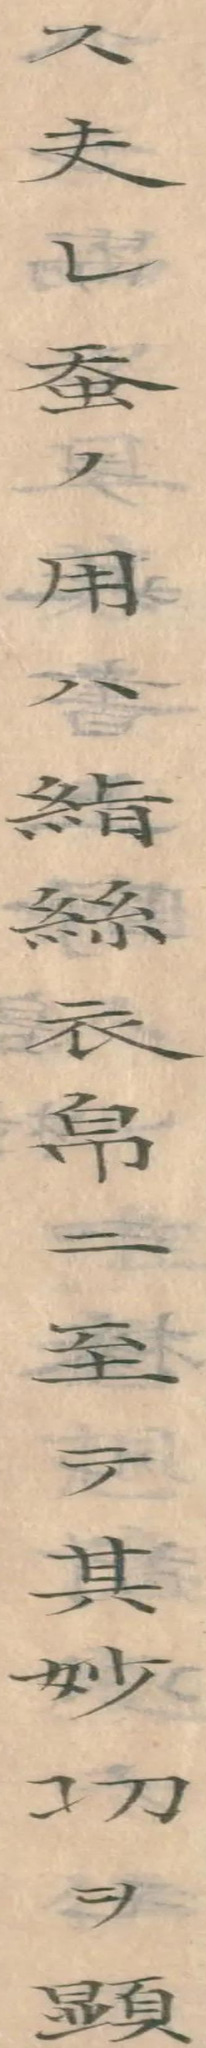ス夫レ蚕ノ用ハ絹糸衣帛ニ至テ其妙功ヲ顕
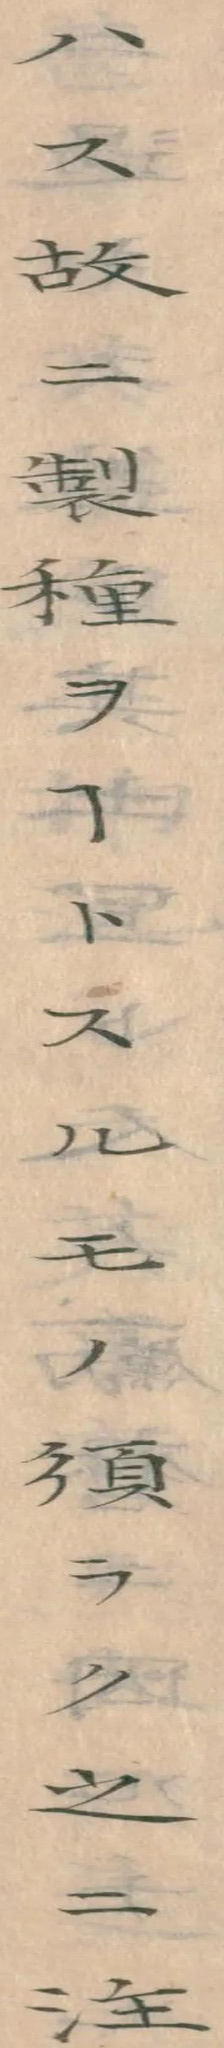ハス故ニ製種ヲコトトスルモノ須ラク之ニ注
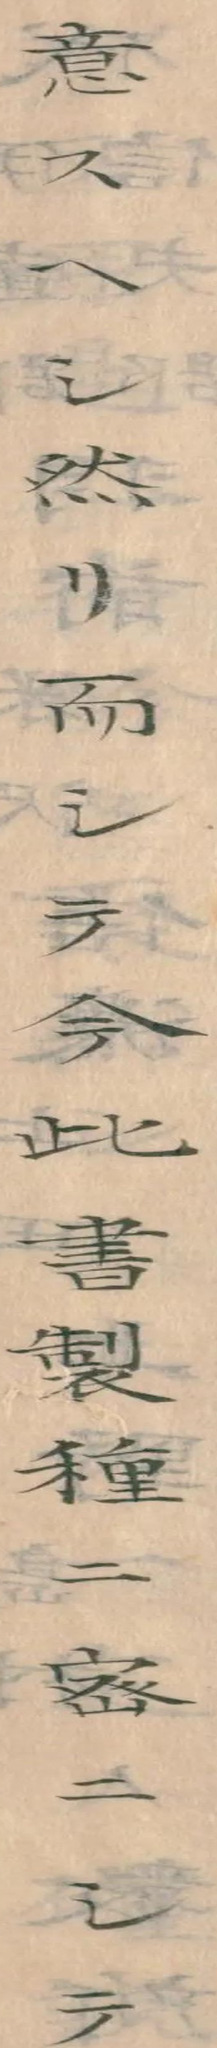意スヘシ然リ而シテ今此書製種ニ密ニシテ
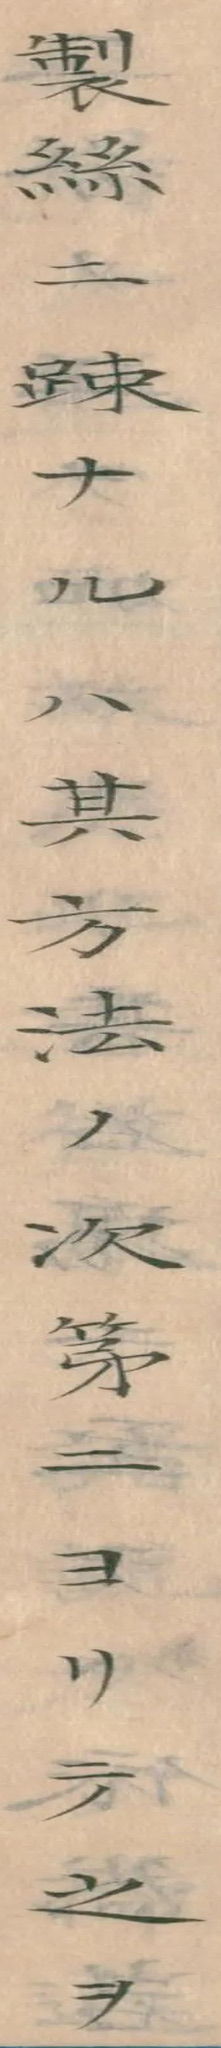製糸ニ疎ナルハ其方法ノ次第ニヨリテ之ヲ
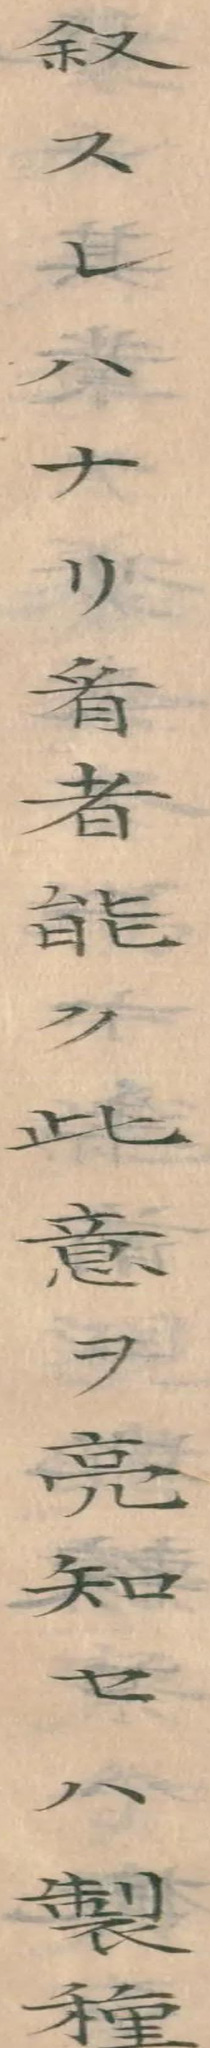叙スレハナリ看者能ク此意ヲ亮知セハ製種
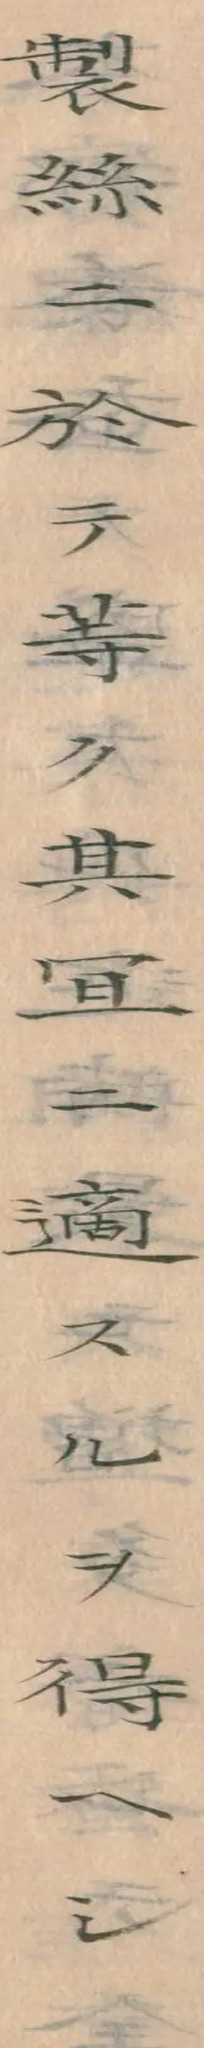製糸ニ於テ等ク其宜ニ適スルヲ得ヘシ
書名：蚕桑集成
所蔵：国立国会図書館 National Diet Library, JAPAN
